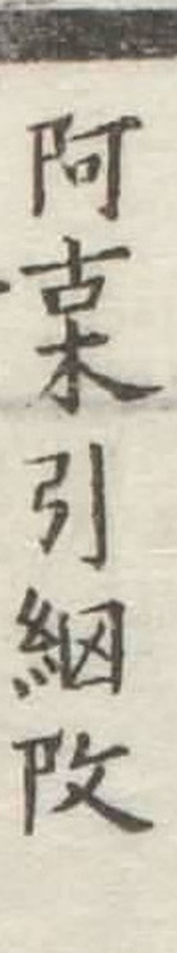阿古木引網改
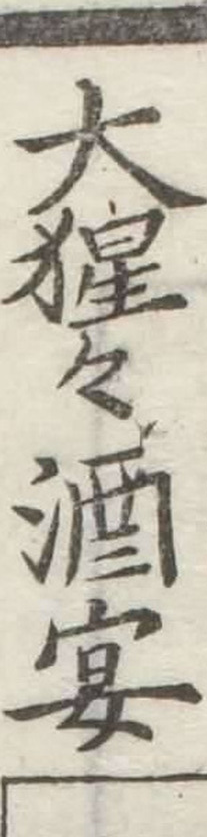大猩々酒宴
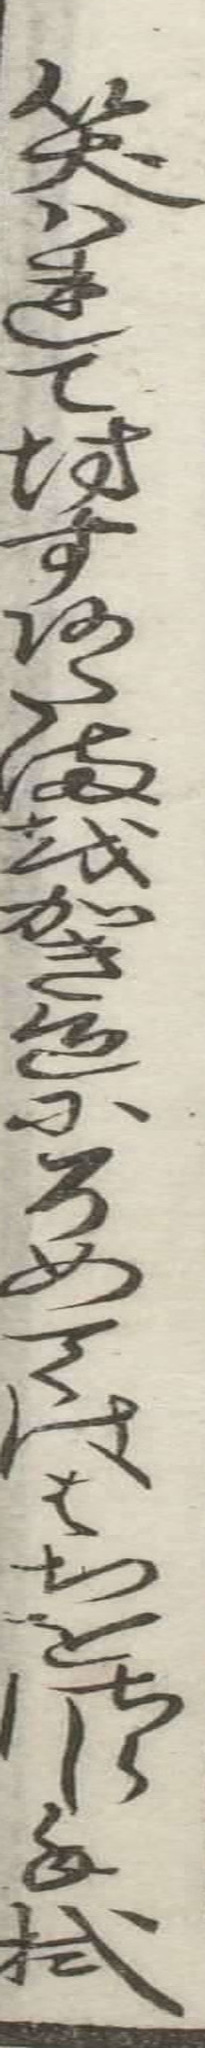笑はれて坊すあたまをかき色にそめてははちをさらし手拭
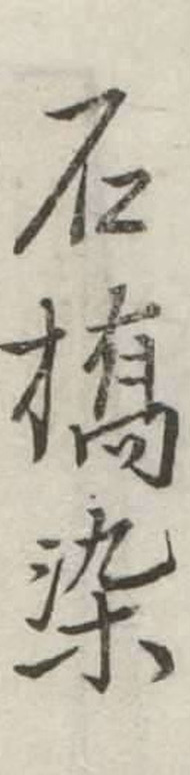石橋染
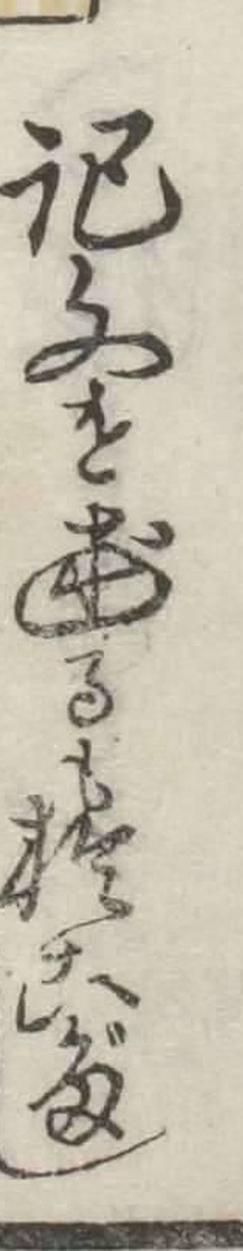記文を述るもおこがまし
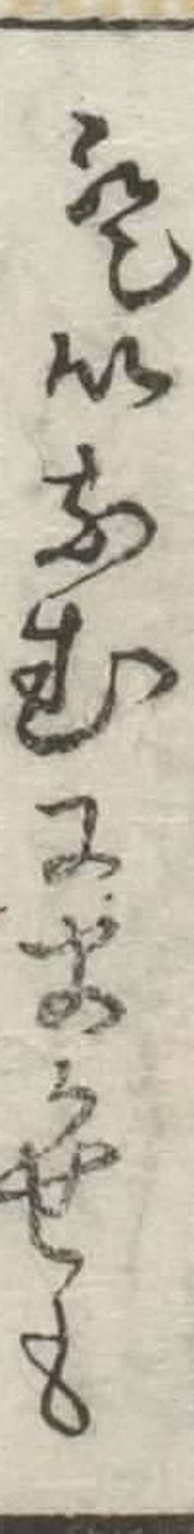といなむにまかせも
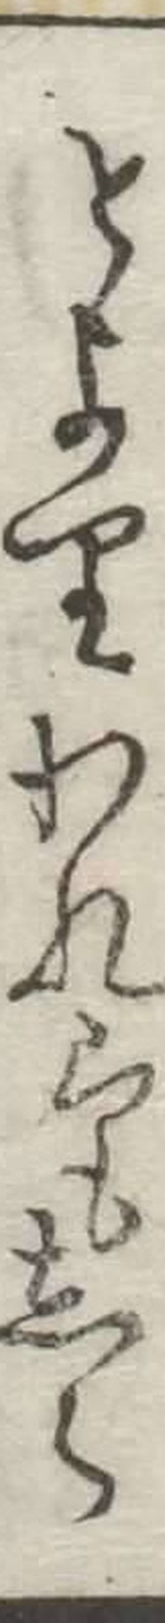とよりわれらもしら
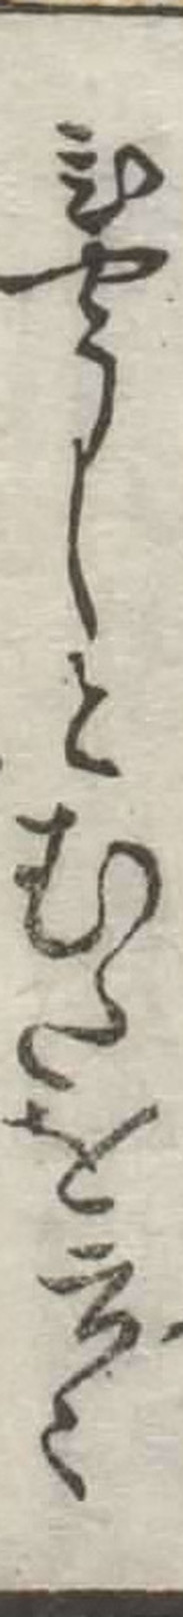ひやうしとむたを云々
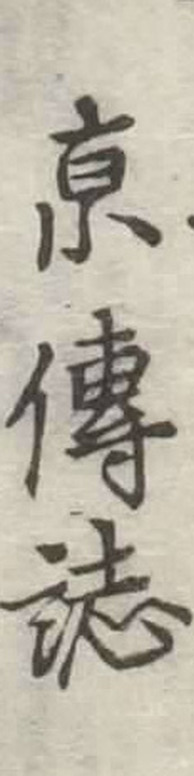京伝誌
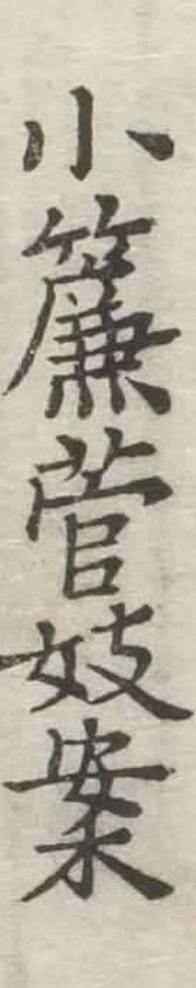小簾菅妓案

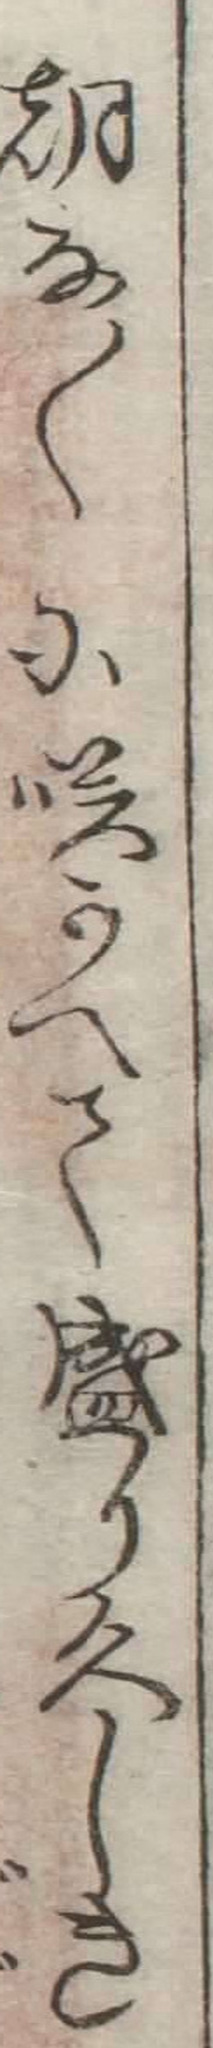朝な〳〵に咲かへて盛り久しき
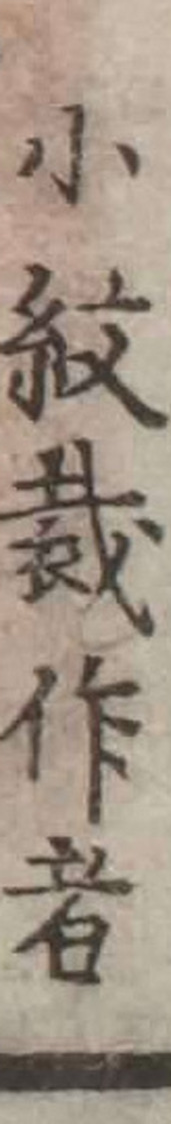小紋裁作者
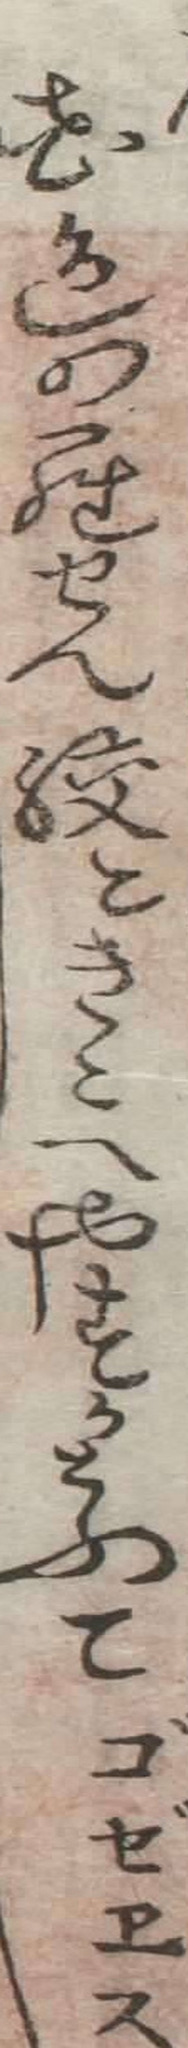花色のらせん絞ときこへやすかとふてゴゼヱス
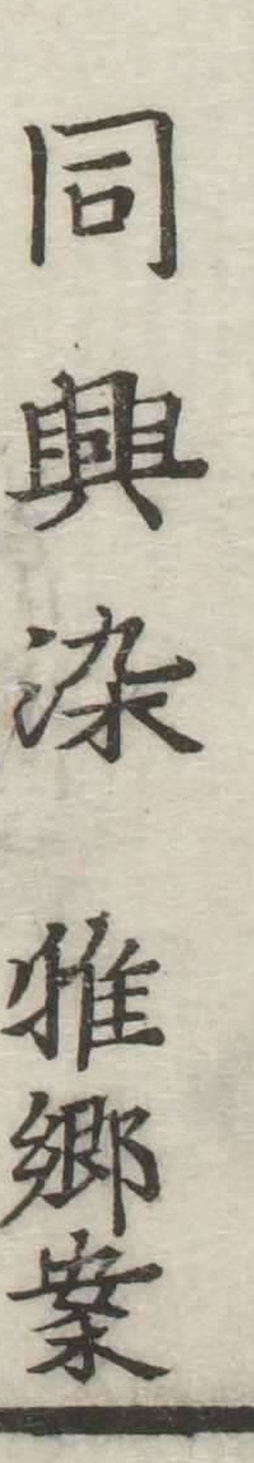同興染雅郷案
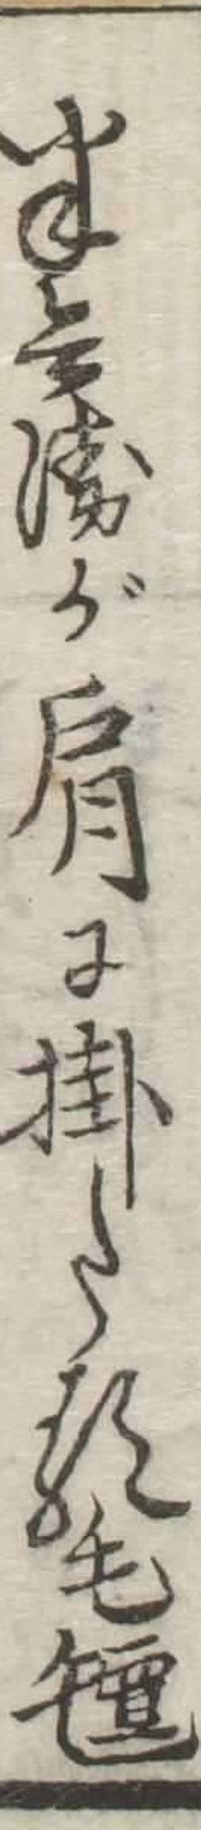半兵衛が肩に掛たる毛氈
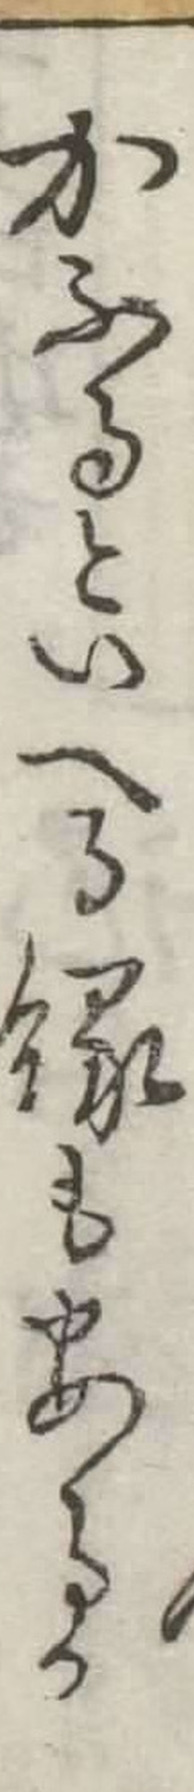かふるといへる縁もあるか
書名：たなくひあわせ
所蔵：国文学研究資料館
